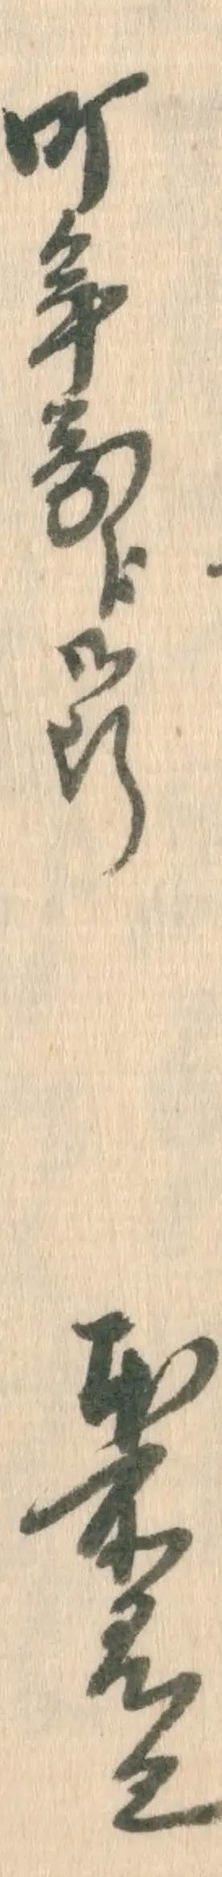町年寄え御断本所見廻
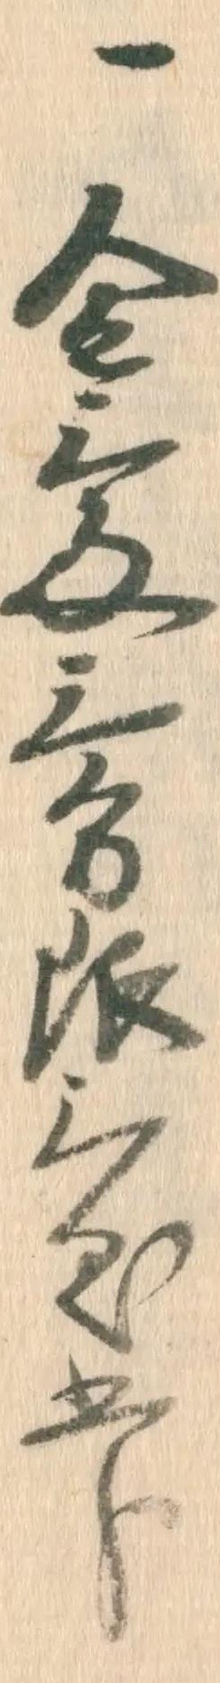一金三両三分銀三匁五分
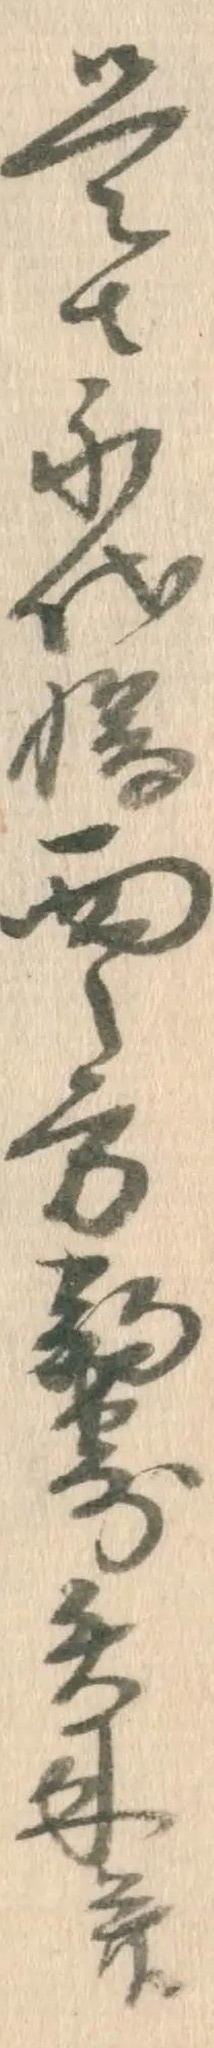是は永代橋西之方駒寄矢来并
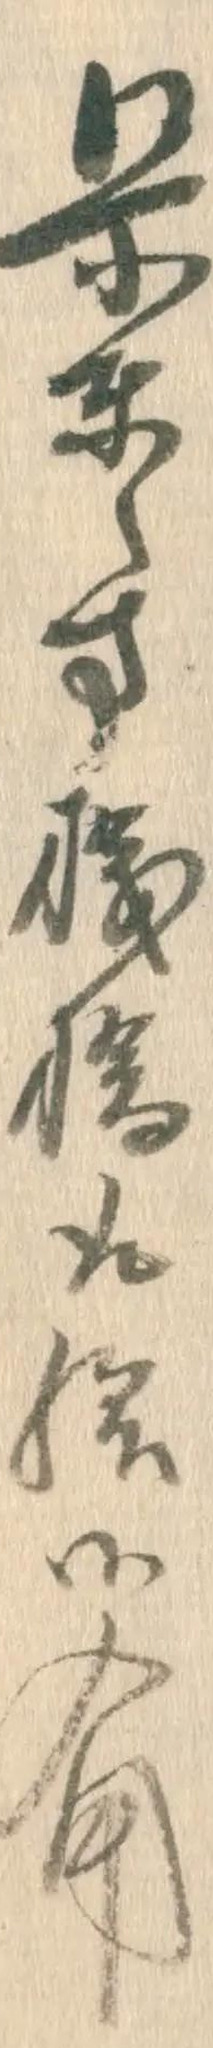同所東之方桟橋取繕御入用

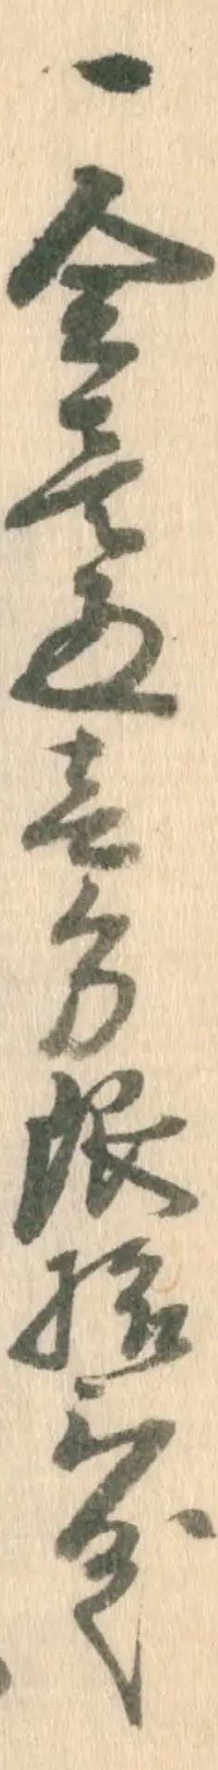一金壱両壱分銀拾三匁
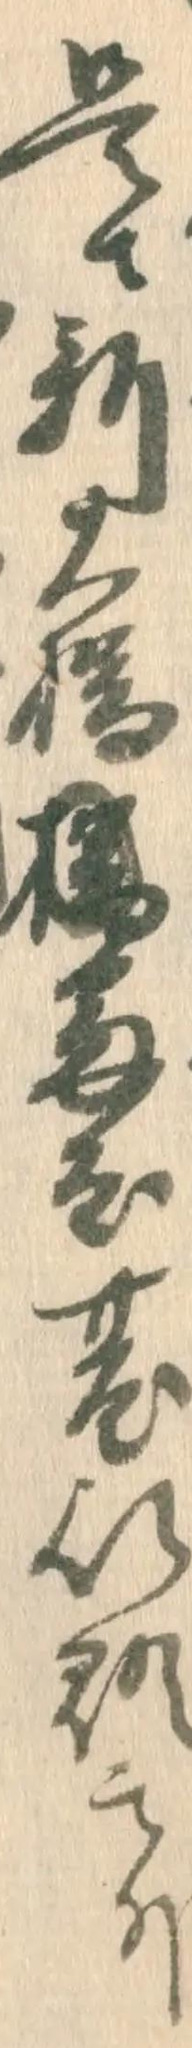是は新大橋「橋」番屋台行灯其外
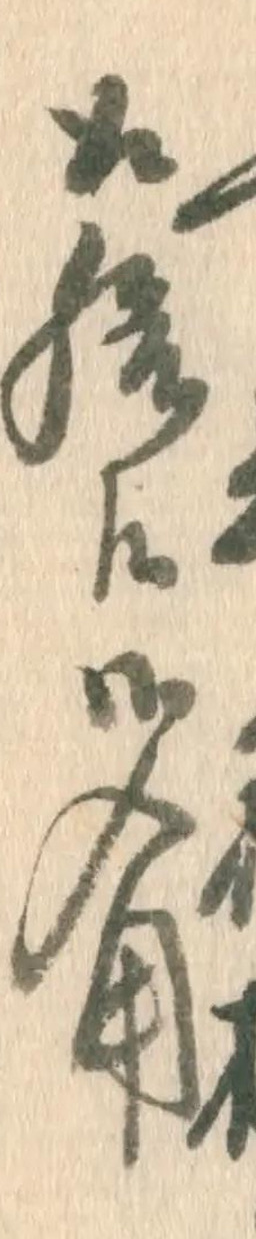取繕候御入用
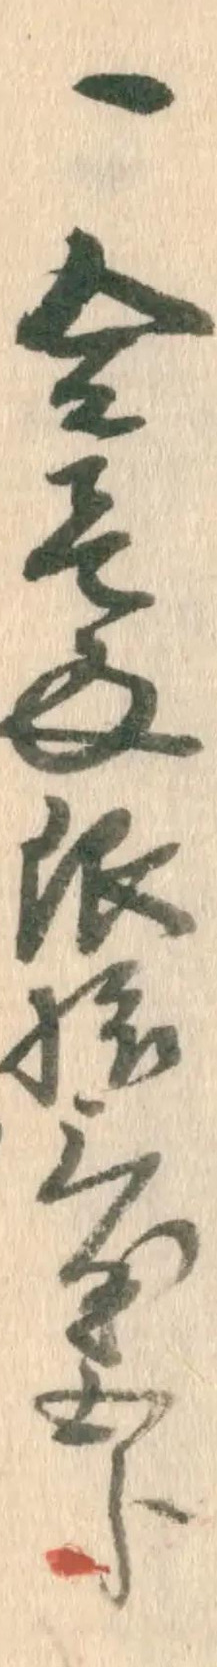一金壱両銀拾三両五分
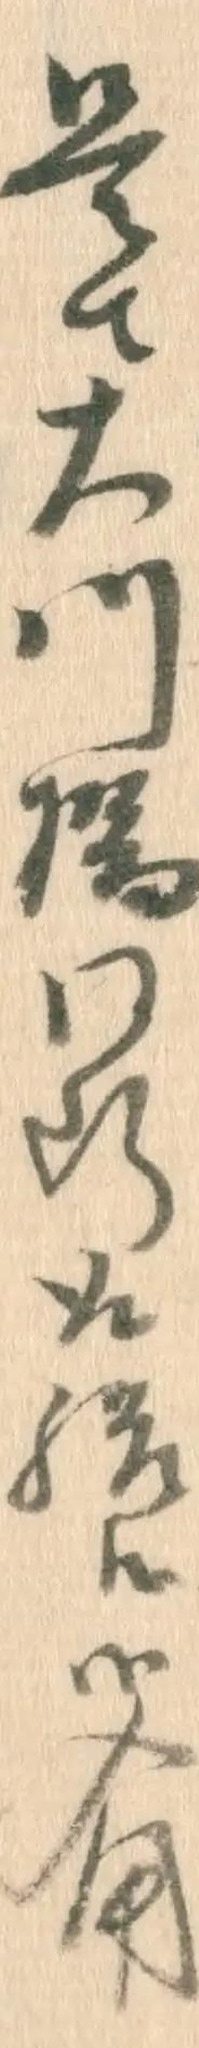是は大川橋同断取繕候御入用
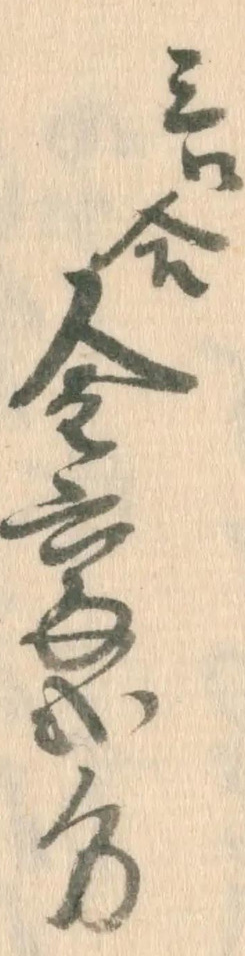金六両弐分
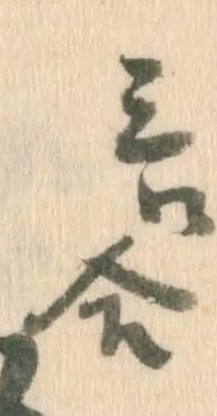三口合
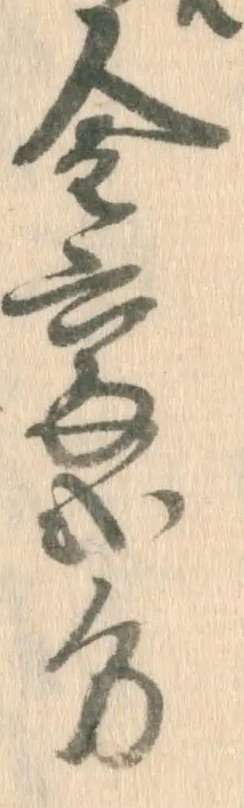金六両弐分
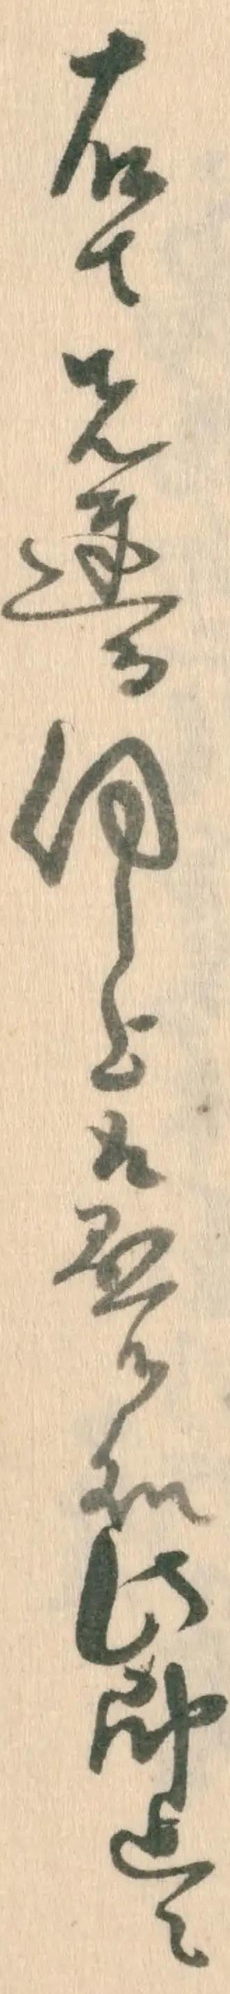右は先達而伺之上取懸候処此節追々
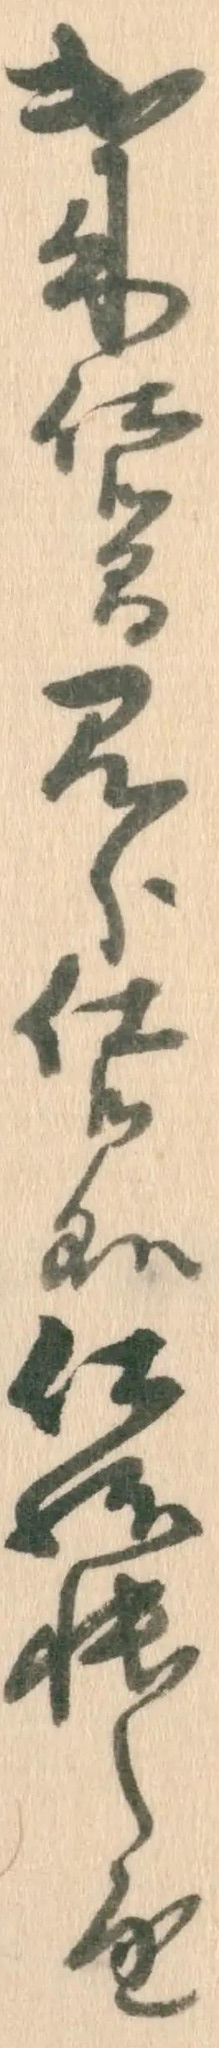出来仕候間見分仕候処仕様帳之通
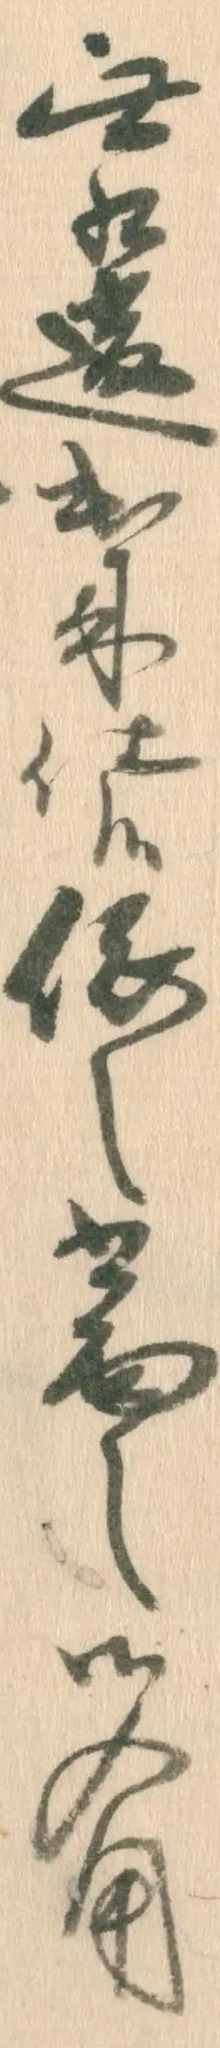無相違出来仕候依之書面之御入用
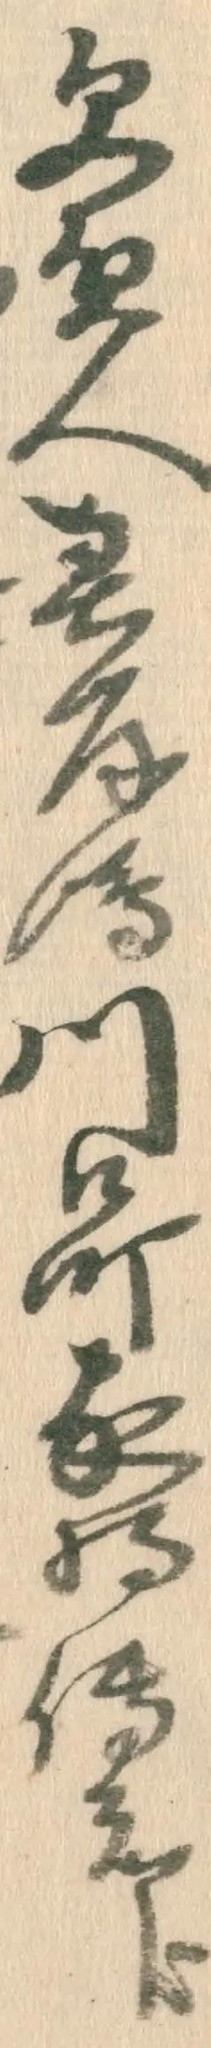受負人霊岸島川口町家持伝吉え
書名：三橋 17巻. [8] 三橋小破御修復書留　但御奉行御掛リ替地震潰橋番屋　嘉永四亥年より安政二卯年迄　下
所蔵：国立国会図書館 National Diet Library, JAPAN
